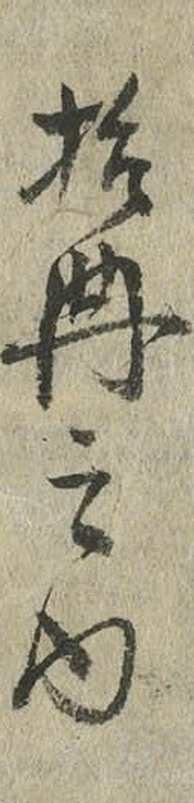十冊之内
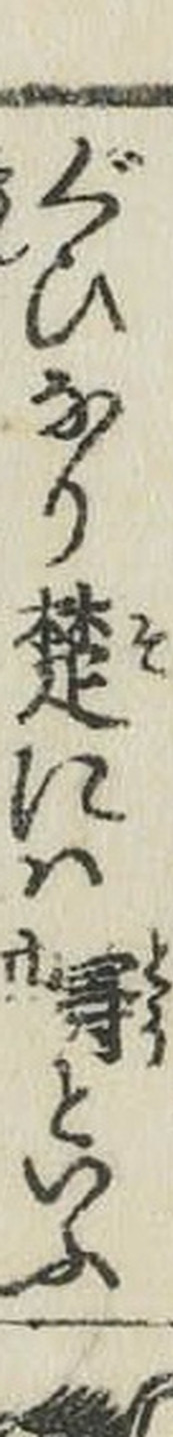ぐひなり楚には幬といふ
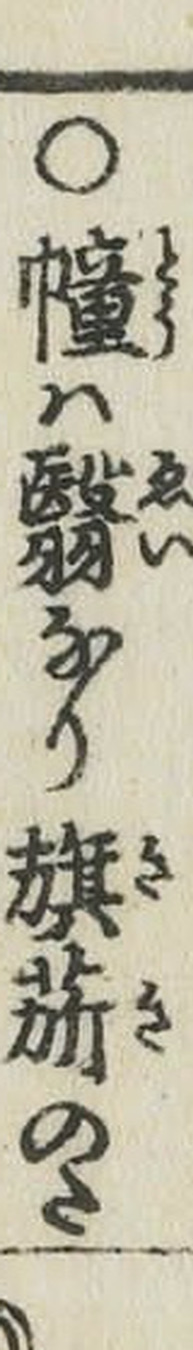○幢は翳なり旗？のた
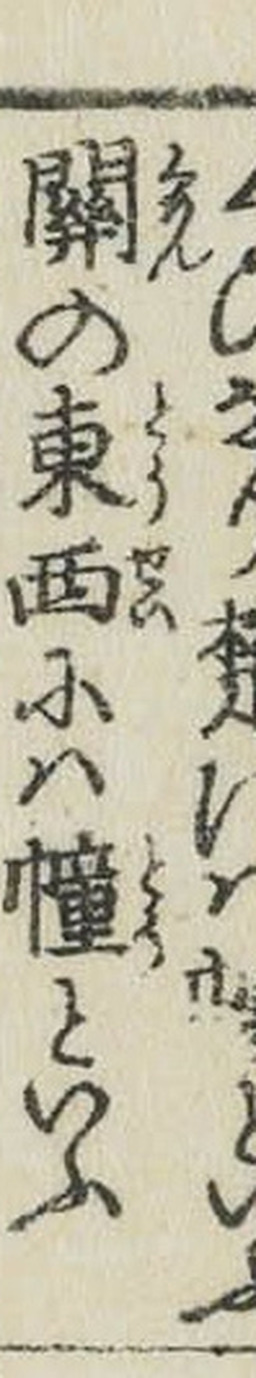関の東西には幢といふ
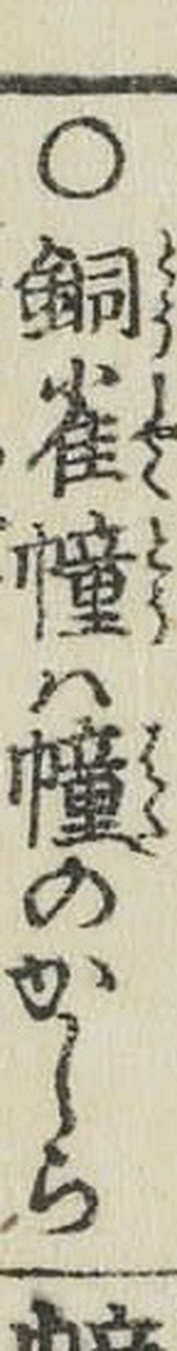○銅雀幢は幢のかしら
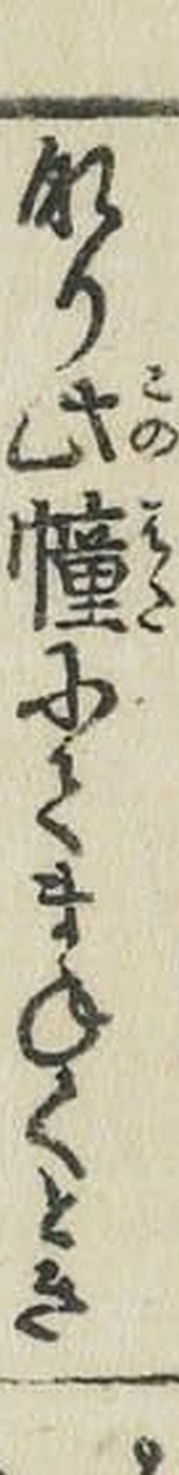なり此幢にてまねくとき
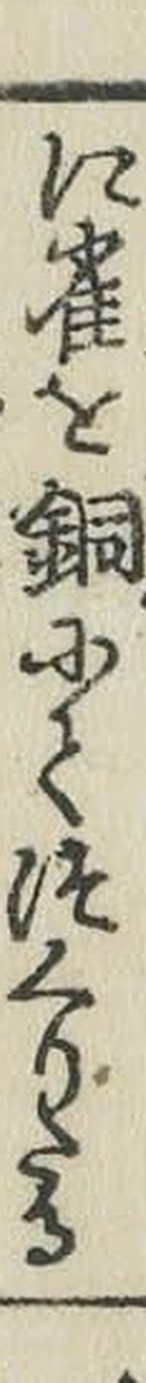に雀を銅にてつくりたる
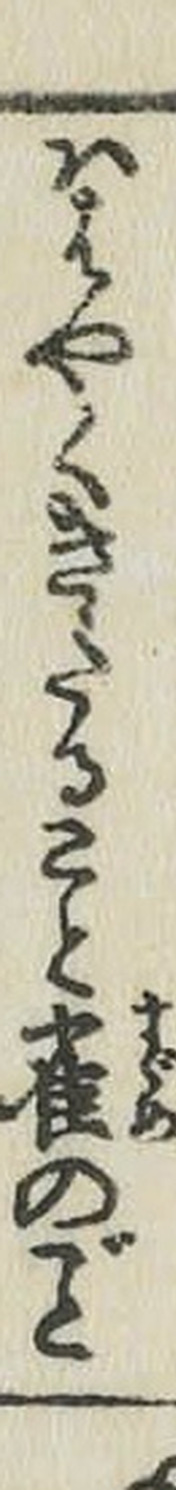ははやくきたること雀のごと
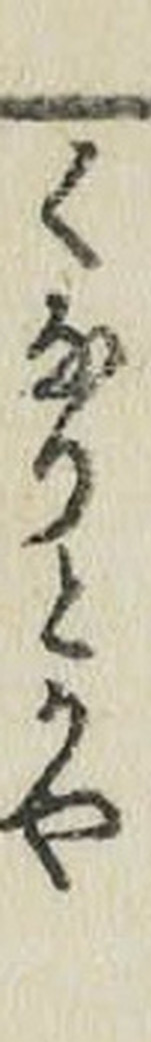くなりとかや
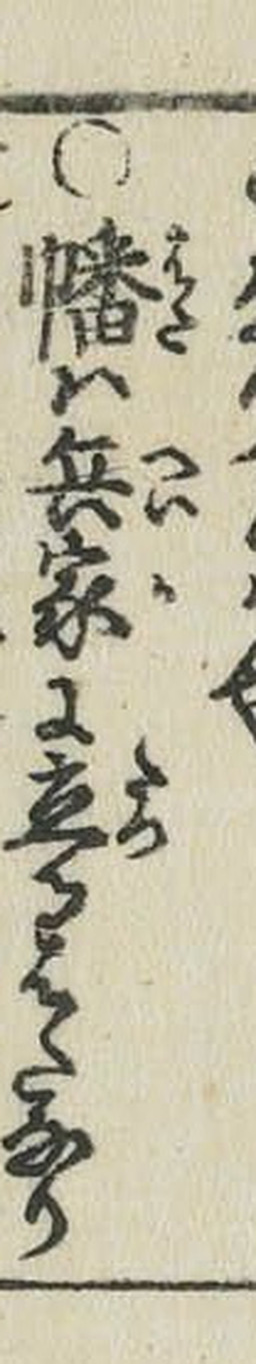○幡は兵家に立るはたなり
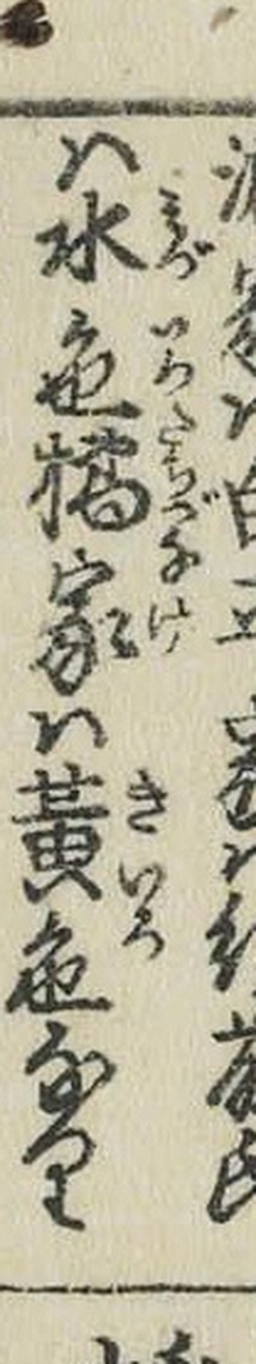は水色橘家は黄色なり
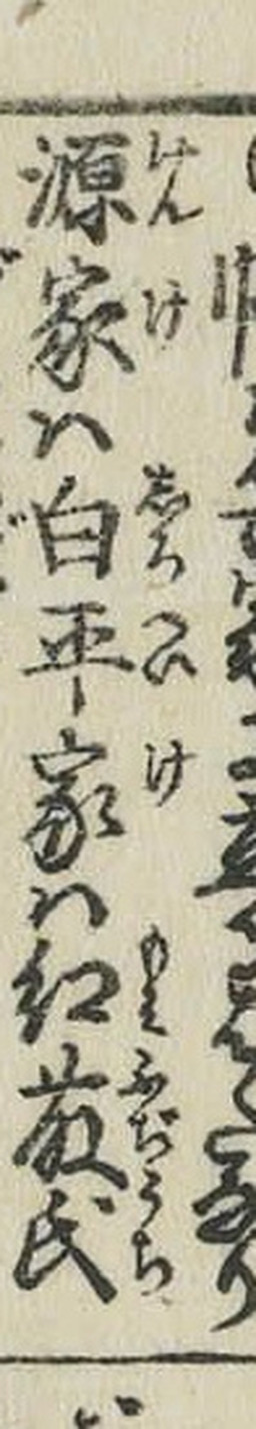源家は白平家は紅藤氏
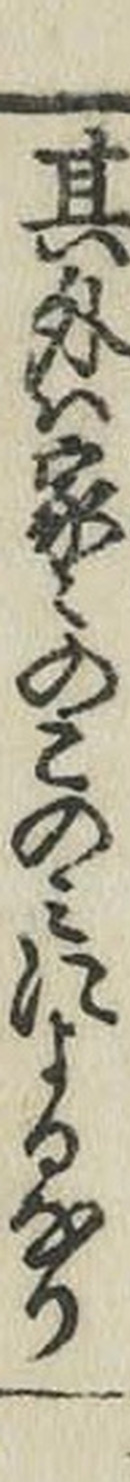其外は家々のこのみによるなり

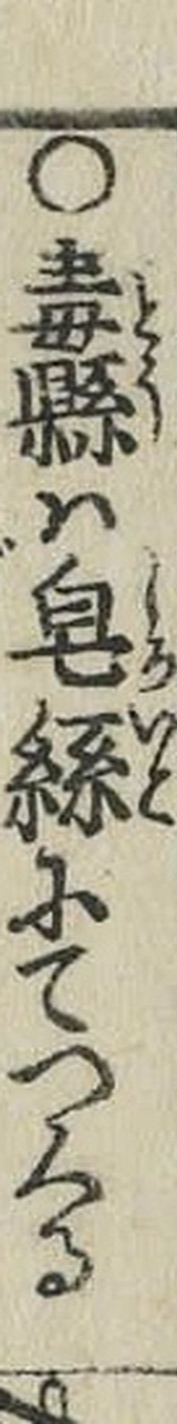○纛は皂糸にてつくる
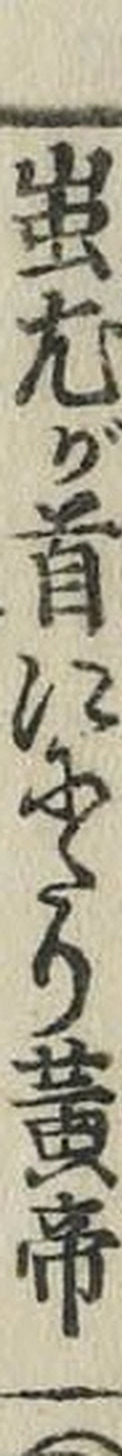蚩尤が首ににたり黄帝
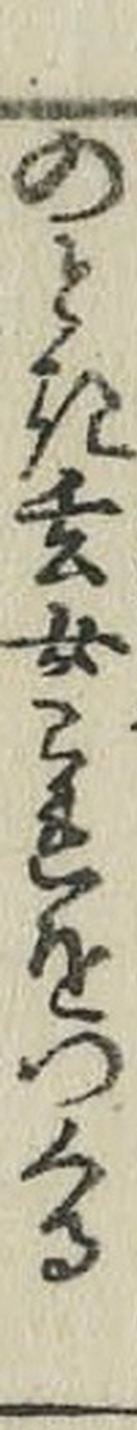のとき玄女これをつくる
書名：増補頭書訓蒙図彙大成 10巻 5:巻之9-11
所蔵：東京学芸大学教育コンテンツアーカイブ
